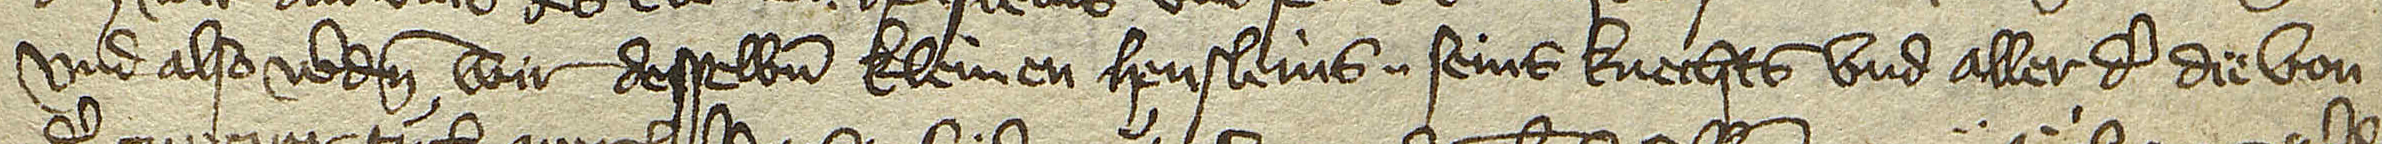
vnd alſo w*dn* wie deſſelbn* kleinen henſleins ~ ſeins knechts vnd aller d* die von
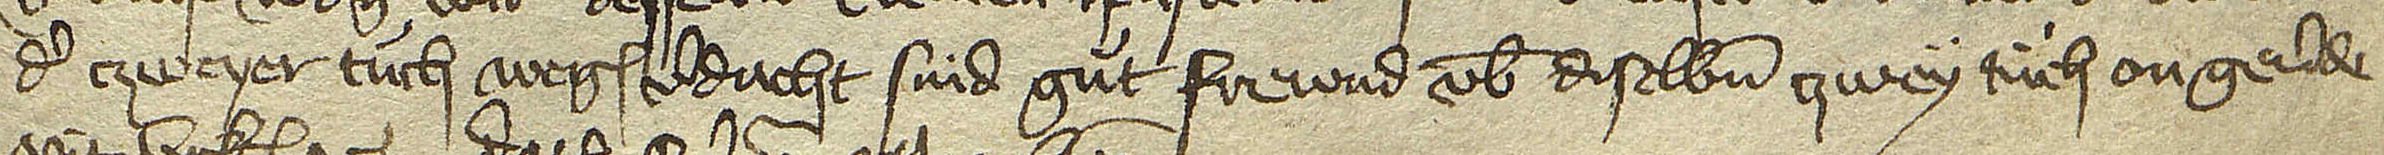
d* cʒweyer tüch weg* v*dacht ſind güt frewnd vb* diſelbn* cʒwey tüch on geu*de
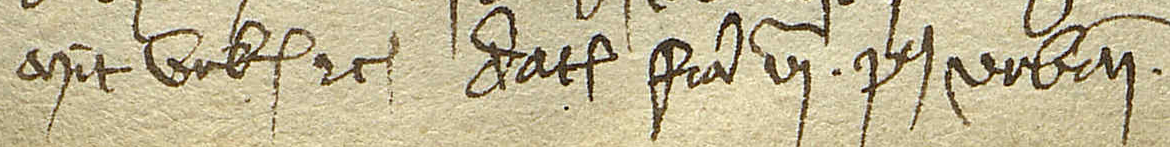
Mit vrk* ec* dat* fia* vi* . p* vrbai* .
